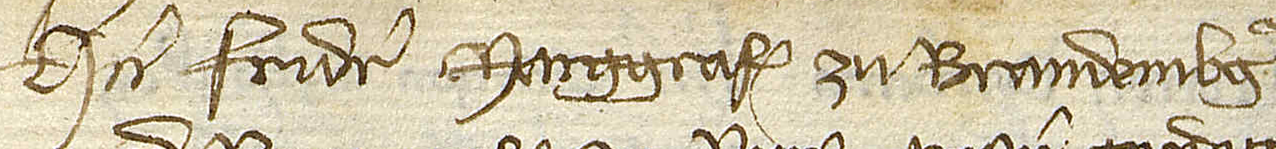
H*n Fridr* Marggraf* ʒu Brandemb*g
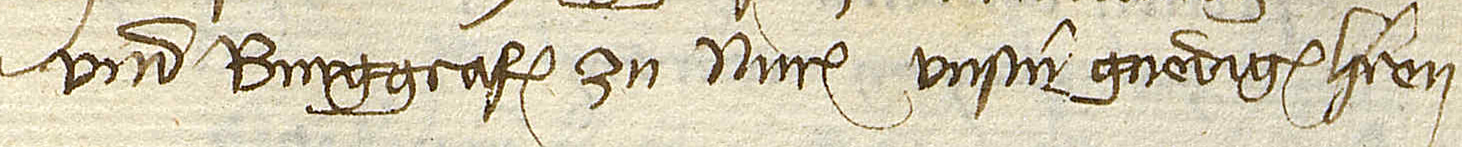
vnd Burggraf* ʒu Nur* vnſ*m gnedig* h*ren
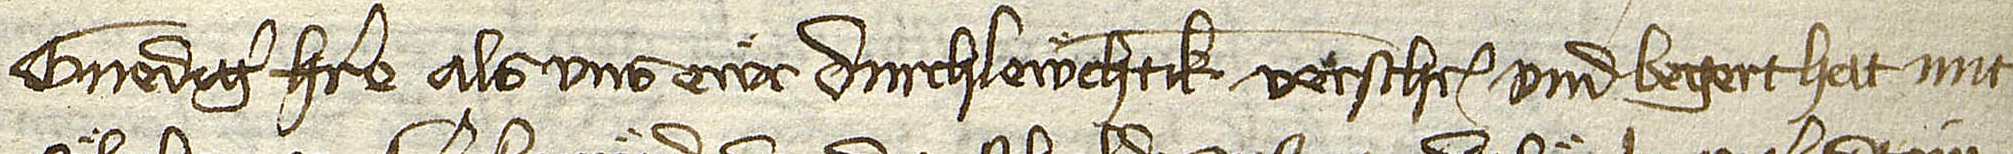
Gnedig* h*re als vns ewr durchlewchtik* verſchr* vnd begert hat mit
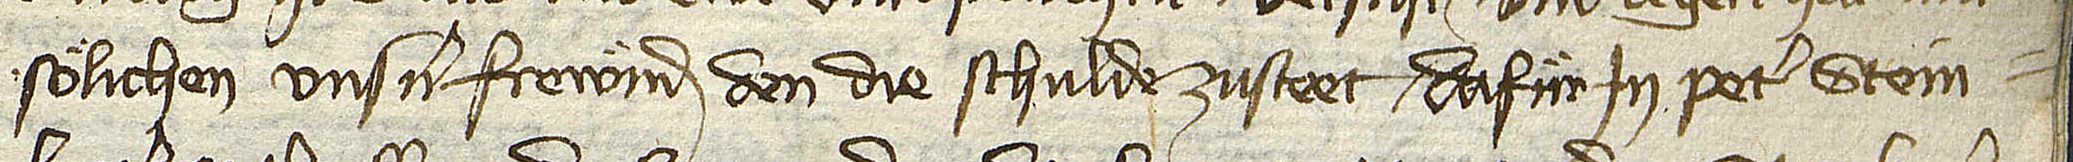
ſölichen vnſ*n frewnd* den die ſchulde ʒuſteet / dafür In pet* Stein =
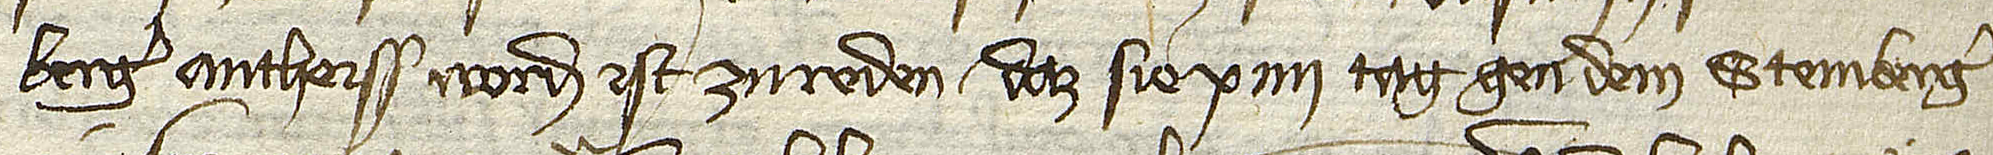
berg* antheiſſ word* iſt ʒureden / daʒ ſie x iiii tag gen dem Steinberg*
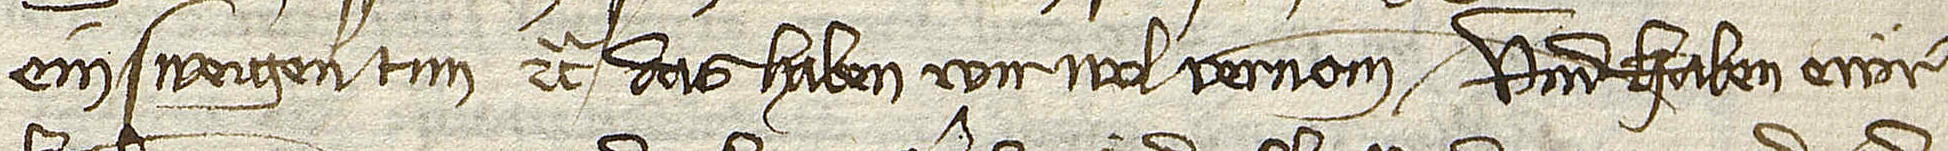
ein ſweigen tun ec* das haben wir wol vernom* / Vnd haben ew*r
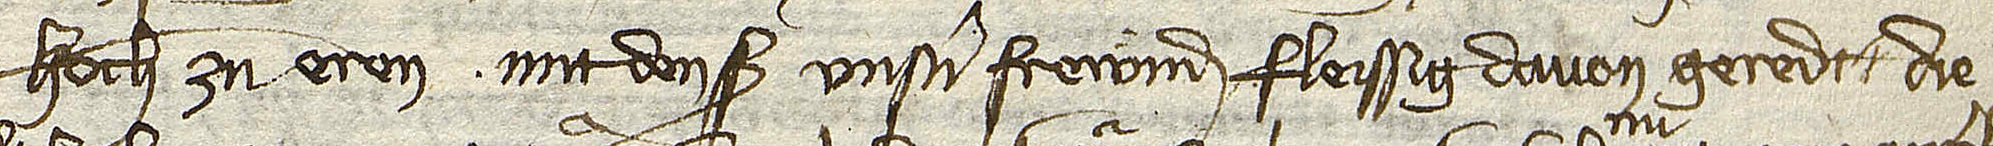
hoch* ʒu eren . mit denſ* vnſ*n frewnd* fleiſſig dauon geredt / die
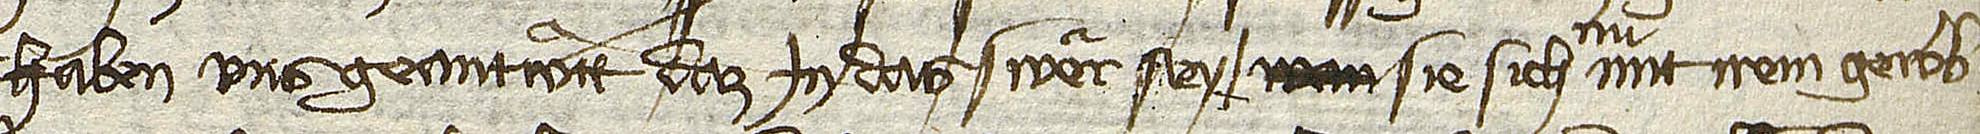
haben vns geantw*tt daʒ In das ſwër ſey wan ſie ſich mit irem gew*b
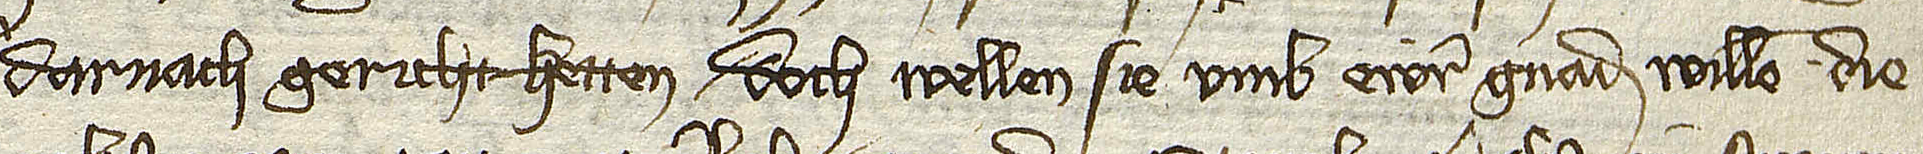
darnach gericht hetten / Doch wellen ſie vmb ew*r gnad* wille* . die
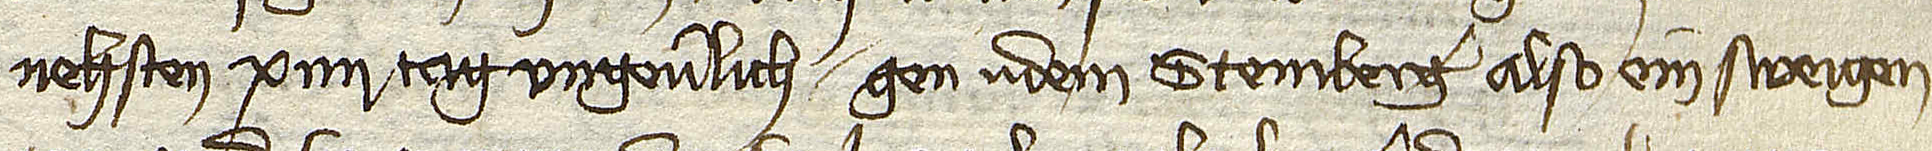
nehſten xiiii tag vngeu*lich / gen ~dem Steinberg* alſo ein ſweigen
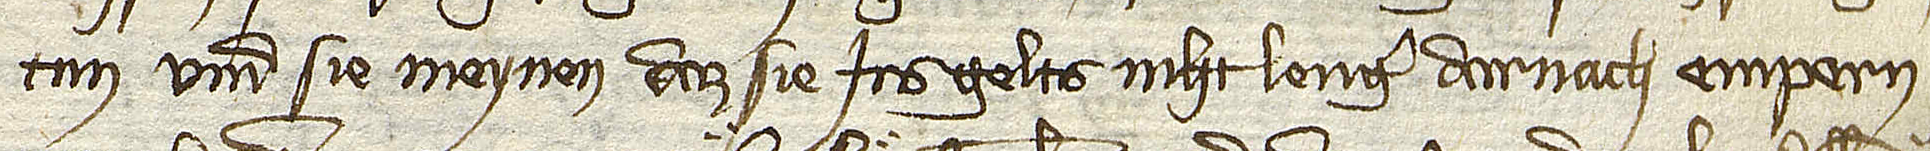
tun vnd ſie meynen daʒ ſie Irs gelts niht leng* darnach empern
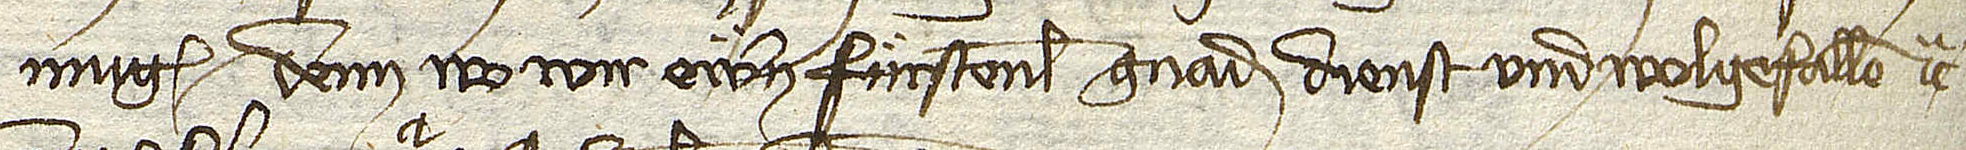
mug* / Denn wo wir ew*n fürſtenl* gnad* dienſt vnd wolgefalle* ec*
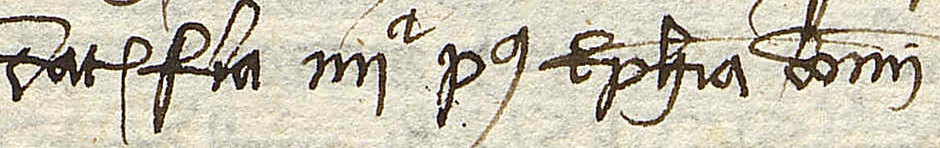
Dat* fia* iiii* p* Ephia* domi*
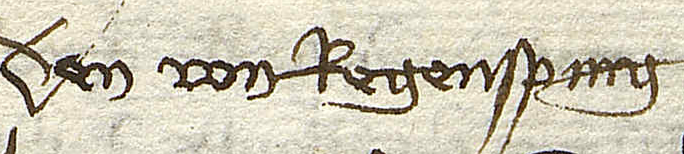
Den von Regenſpurg
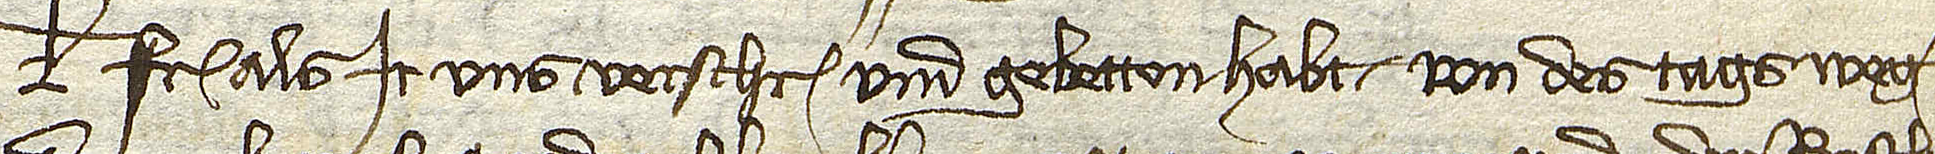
L* fr* als Ir vns verſchr* vnd gebetten habt / von des tags weg*
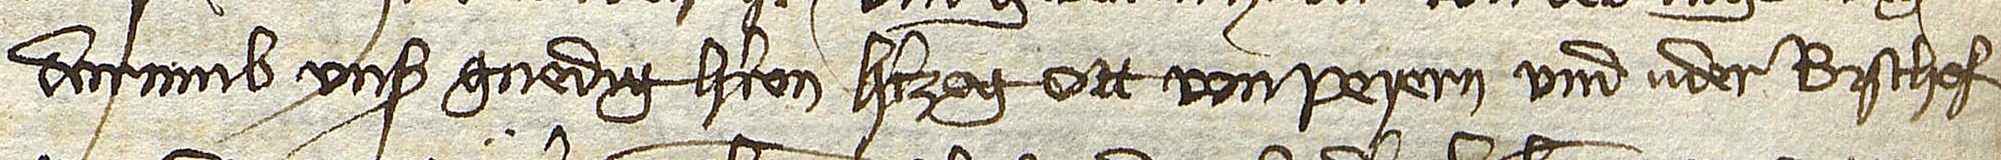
darumb vnſ* gnedig h*ren h*cʒog Ott von Peyern vnd ~ der Biſchof
